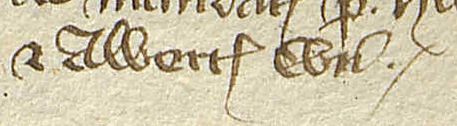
@ Albert* Ebn* . /
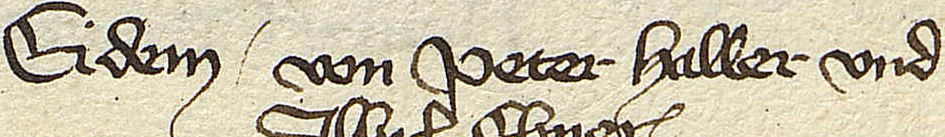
Eidem / von Peter haller vnd
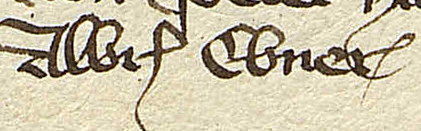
Albr* Ebner*
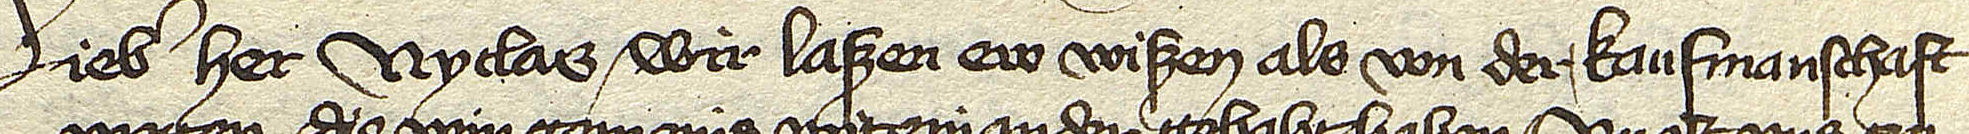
Lieb* her Nyclas / wir laſʒen ew wiſʒen als von der kaufmanſchaft
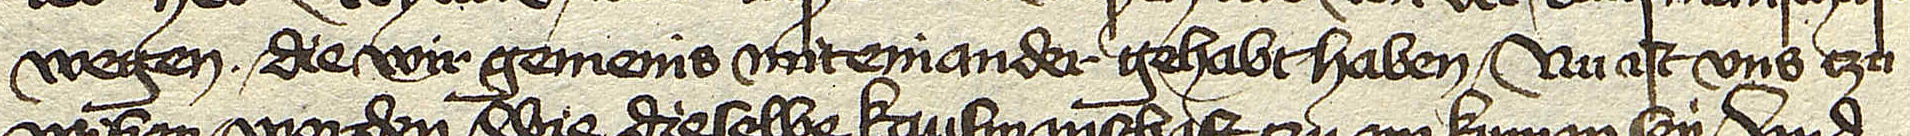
wegen / die wir gemeins miteinander gehabt haben / Nu iſt vns cʒu
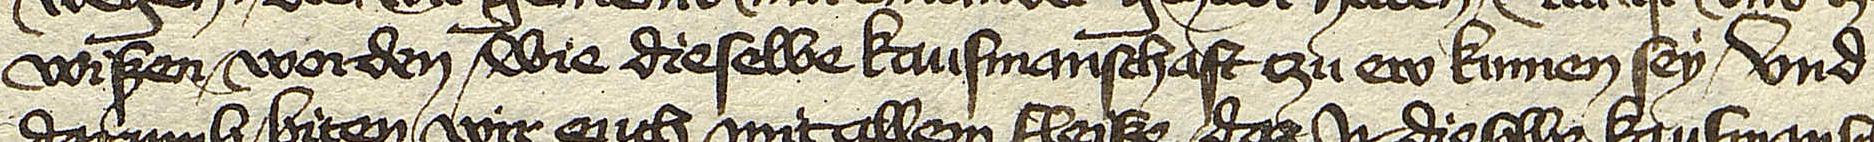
wiſʒen worden / wie dieſelbe kaufmanſchaft cʒu ew kumen ſey / Vnd
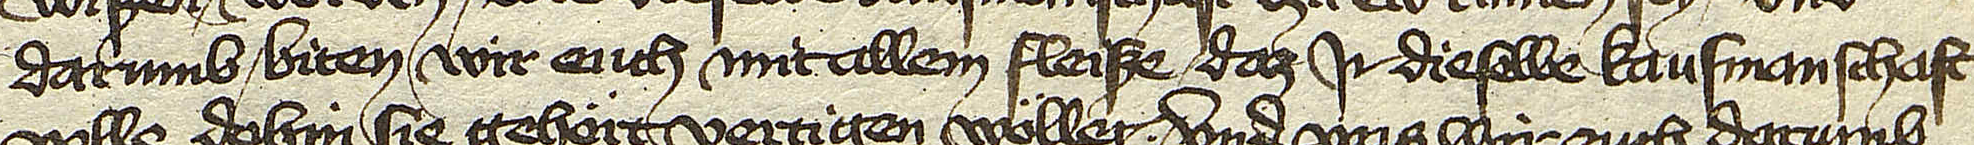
darumb / biten wir euch mit allem fleiſʒe / daʒ Ir dieſelbe kaufmanſchaft
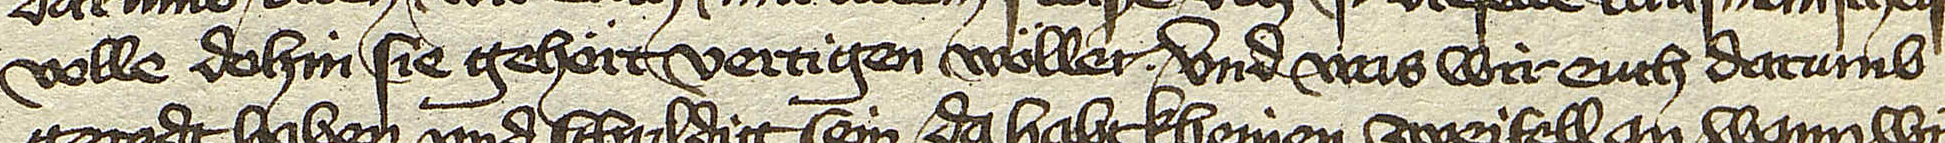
volle dohin ſie gehört vertigen wöllet . / Vnd was wir euch darumb
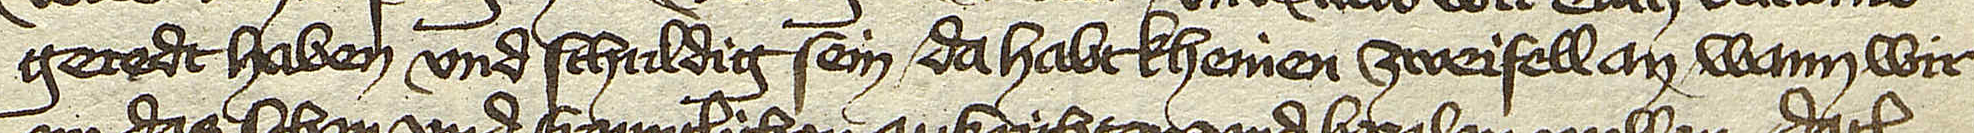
geredt haben vnd ſchuldig ſein / da habt kheinen cʒweifell an / wann wir
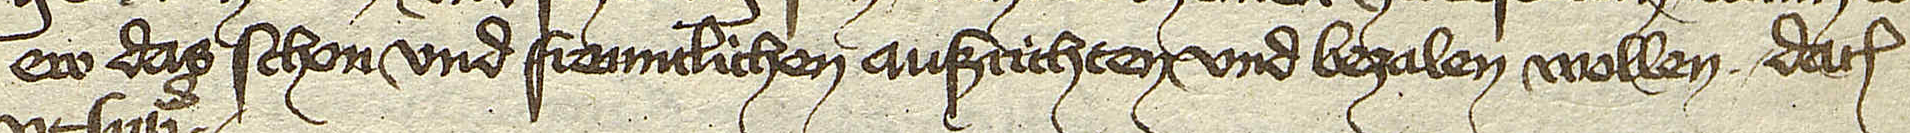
ew das ſchon vnd freuntlichen auſʒrichten vnd beʒalen wollen . / dat*
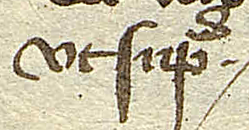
vt ſup* . /
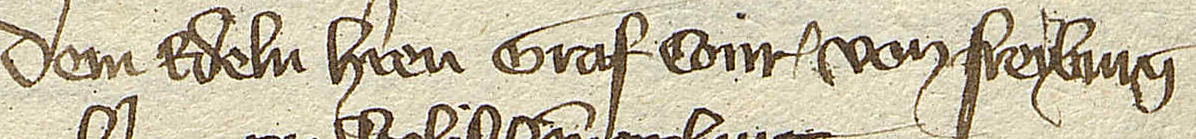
Dem Edeln hr*en Graf Conr* von Freyburg
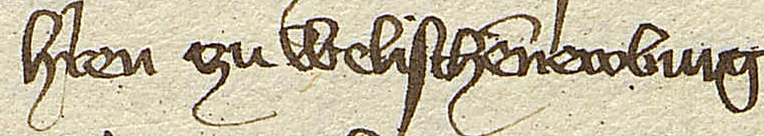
h*ren cʒu Weliſche*newburg
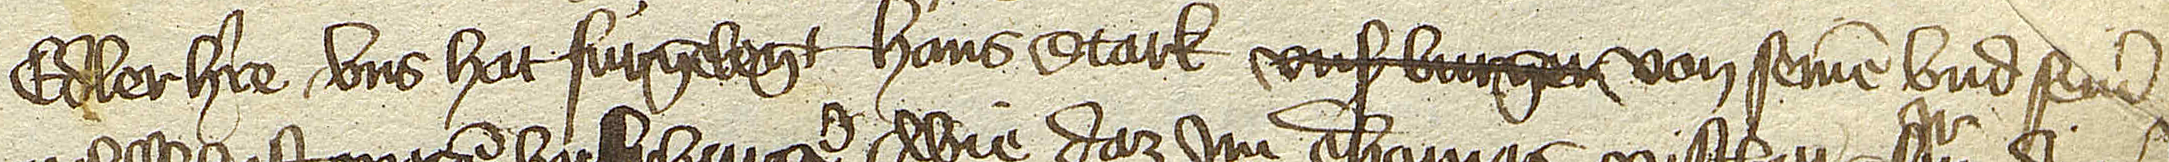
Edler h*re / vns hat fürgelegt hans Stark vnſ* burger von ſeine* vnd ſein*
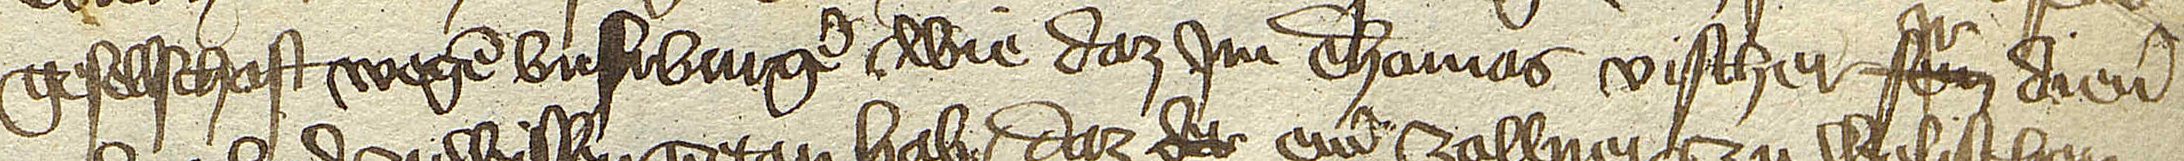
geſellſchaft wege* vnſ*r burg* / wie daʒ Im Thomas viſcher ſein dien*
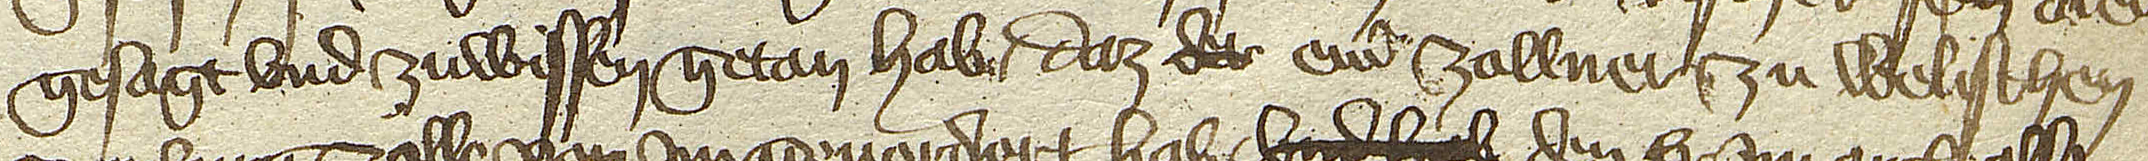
geſagt vnd cʒuwiſſen getan hab / daʒ der ew* cʒollner cʒu Weliſchen
